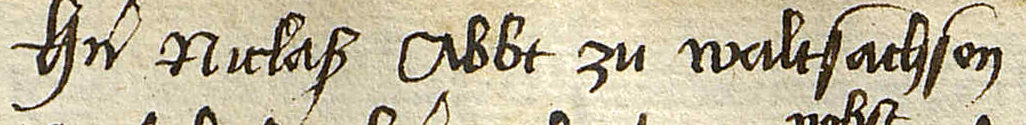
Hn* Niclaſ* Abbt ʒu waltſachſen
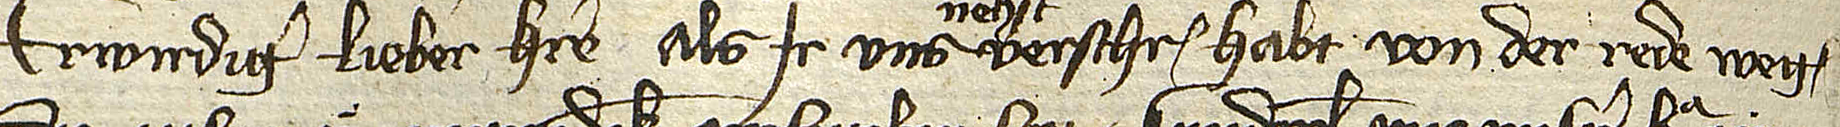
Erwirdig* lieber hre* als Ir vns verſchr* habt von der rede weg*
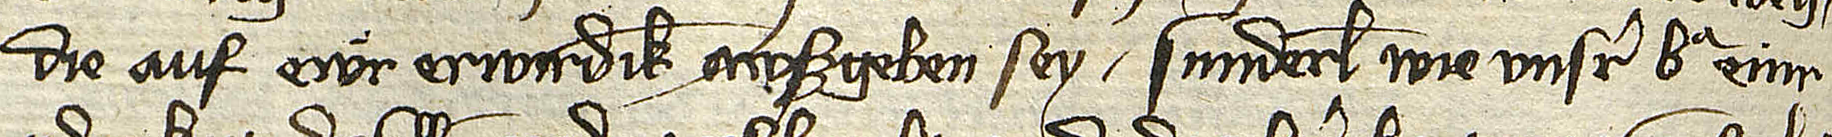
die auf ewr erwirdik* awſʒgeben ſey / ſunderl* wie vnſ*r b* einr
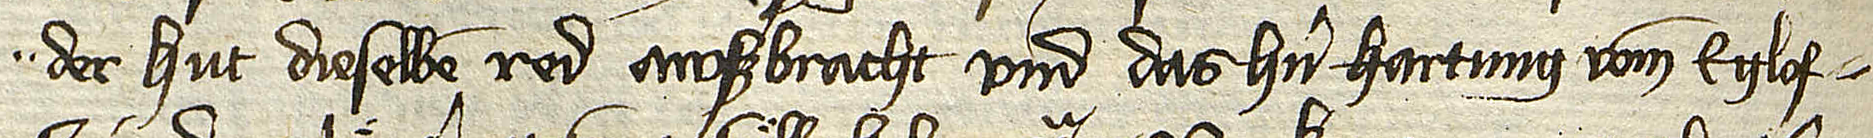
~ der hut dieſelbe* red awſʒbracht vnd das h*n hartung vom Eglof =
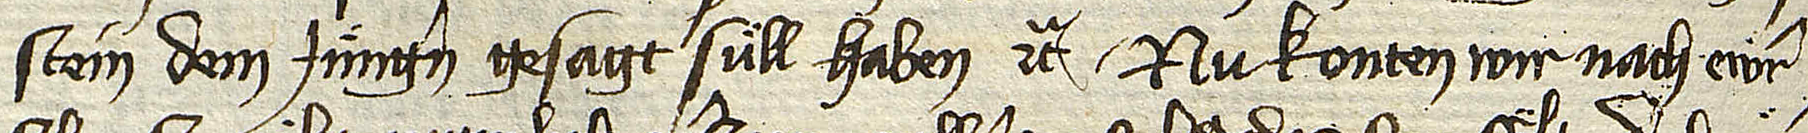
ſtein dem Iüng*n ſüll haben ec* / Nu konten wir nach ewr*
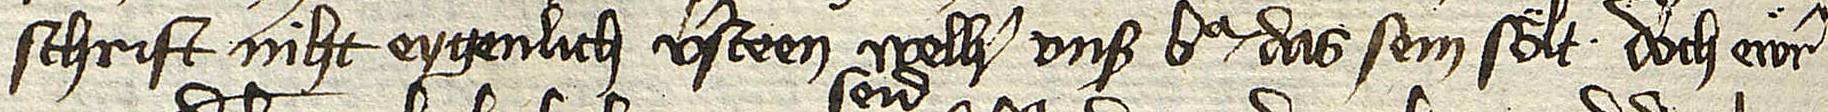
ſchrift niht eygenlich v*ſteen welh* vnſ* b* das ſein ſölt . doch ewr*
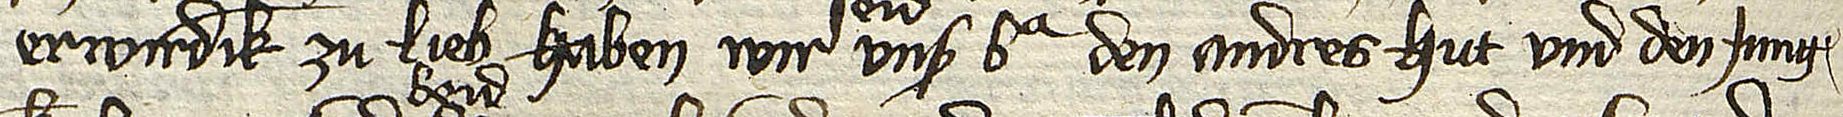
erwirdik* ʒu lieb haben wir vnſ* b* den andres hut vnd den Iung*
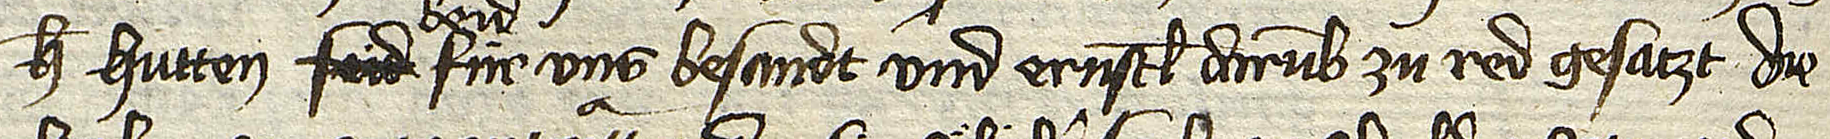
h* hutten ſeid für vns beſandt vnd ernſtl* darub* ʒu red geſacʒt die
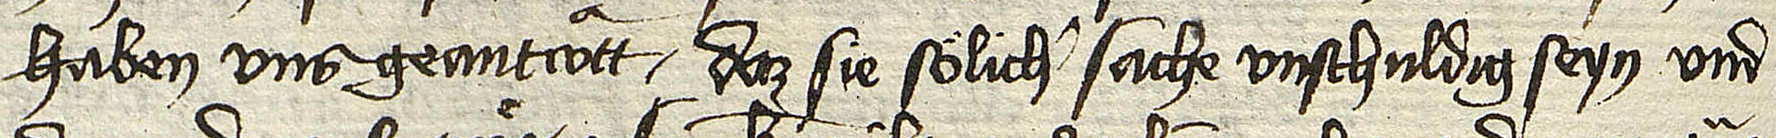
haben vns geantw*tt / daʒ ſie ſölich* ſache vnſchuldig ſeyn vnd
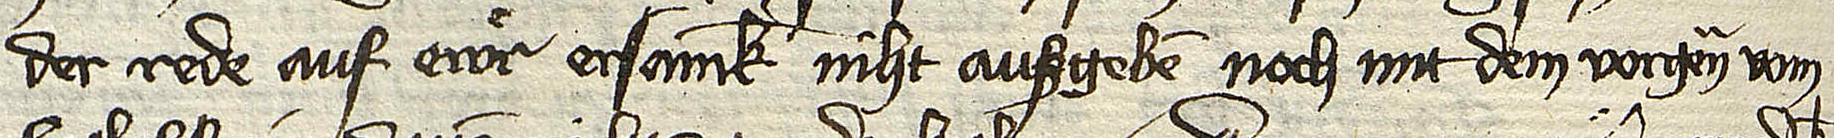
der rede auf ewr erſamk* niht auſʒgebe* noch mit dem vorgen* vom
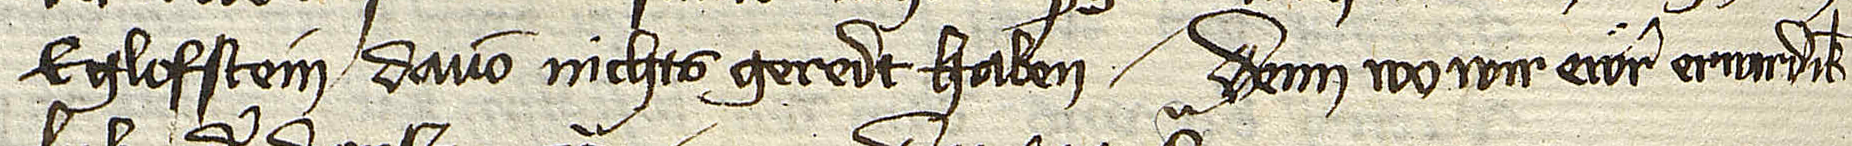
Eglofſtein dauo* nichts geredt haben / Denn wo wir ewr* erwirdik*
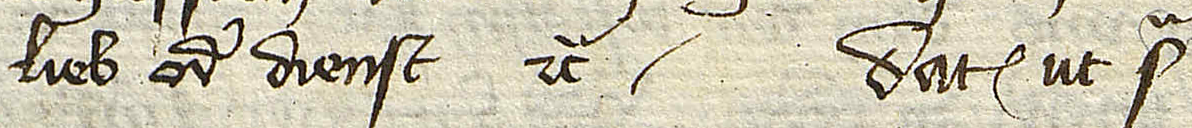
lieb od* dienſt ec* / Dat* ut ſ*
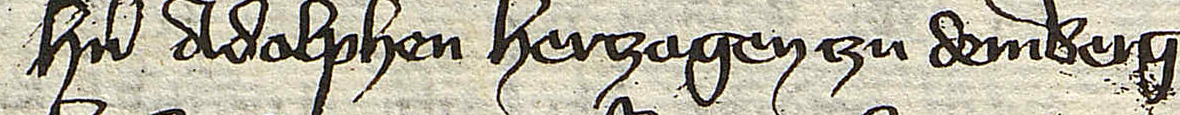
Hn* Adolphen hercʒogen cʒu dem Berg
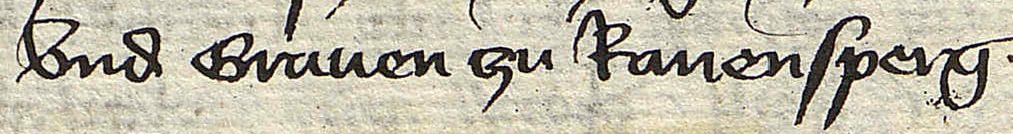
vnd Grauen cʒu Rauenſperg .
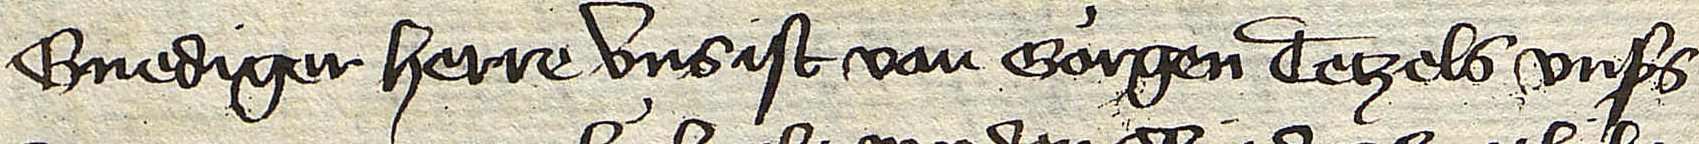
Gnediger herre Vns iſt von Görgen Tecʒels vnſ*s
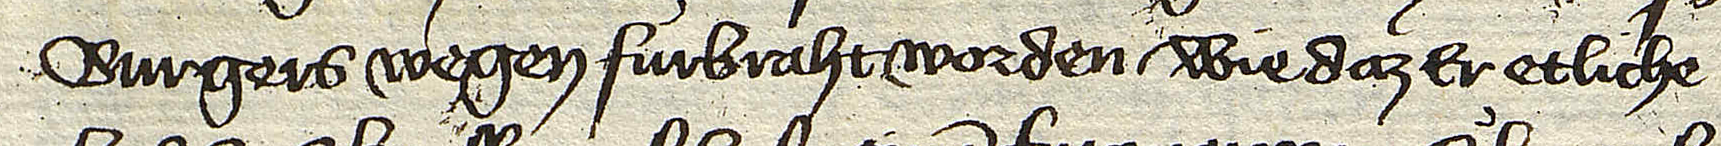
Burgers wegen fürbraht worden / wie daʒ Er etliche
